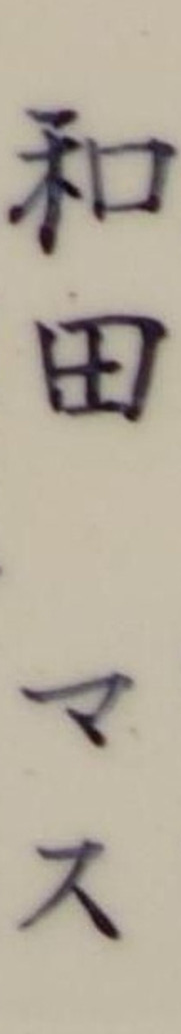和田マス
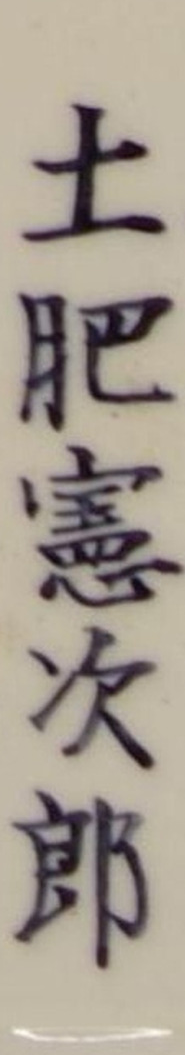土肥憲次郎
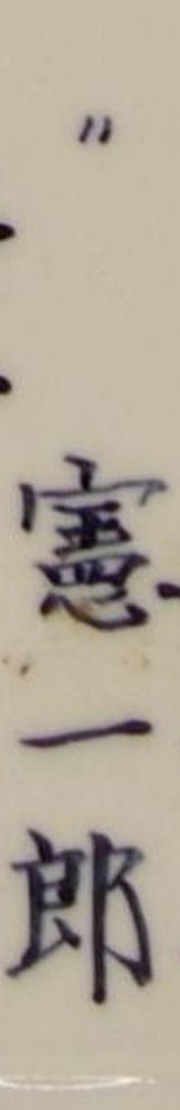憲一郎
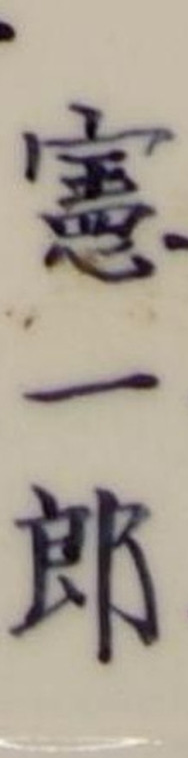憲一郎
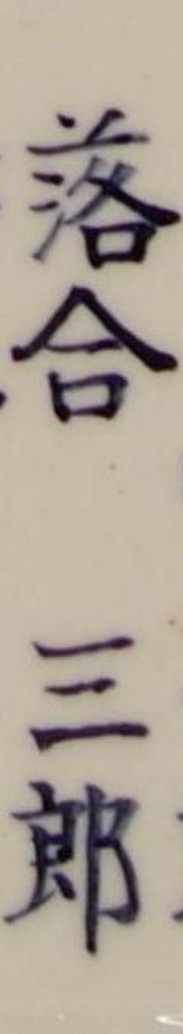落合三郎
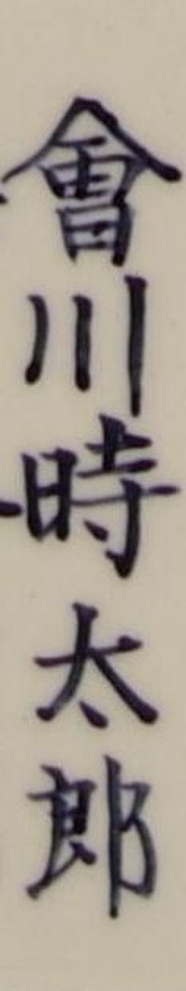會川時太郎
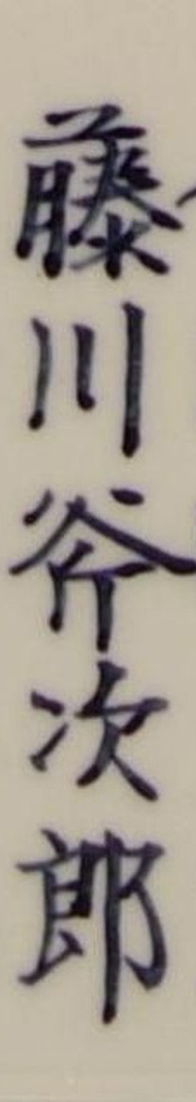藤川斧次郎
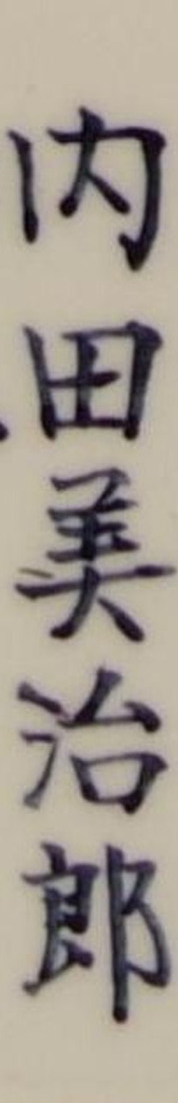内田美治郎
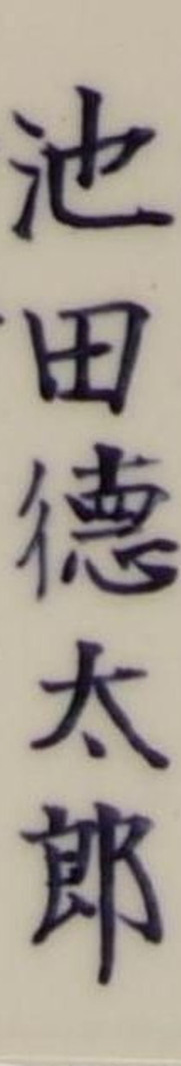池田徳太郎
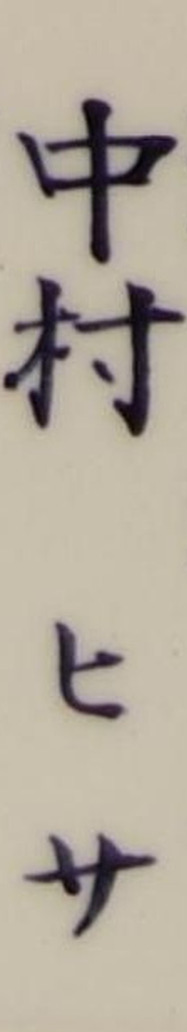中村ヒサ
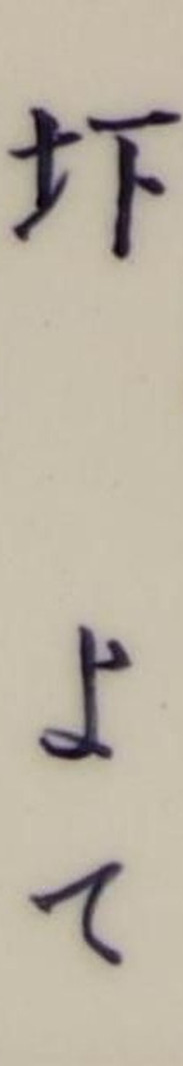圷よて
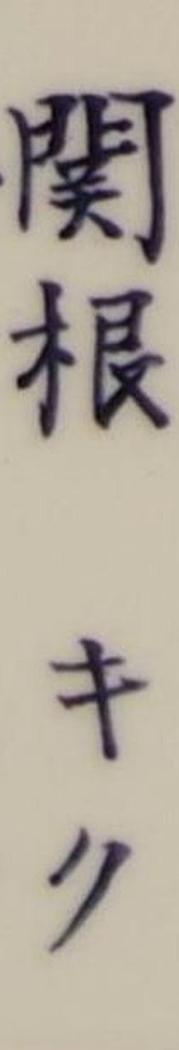関根キク
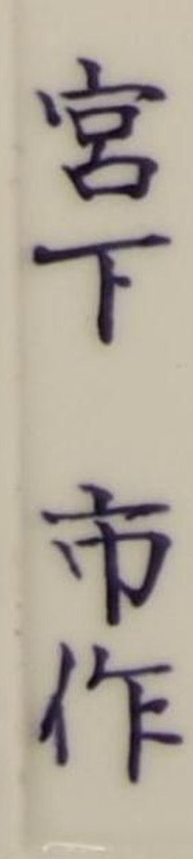宮下市作

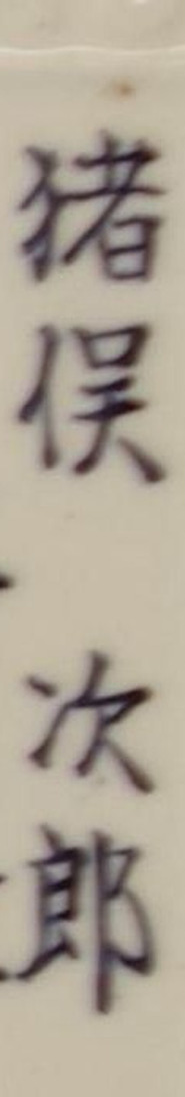猪俣次郎
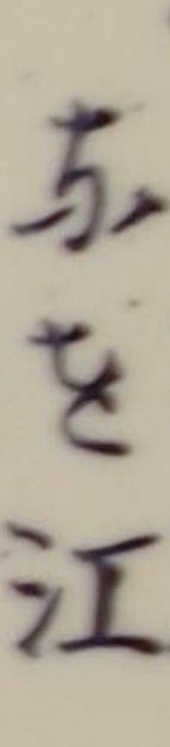なを江
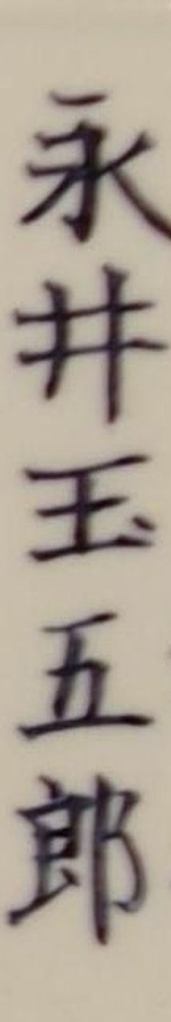永井玉五郎
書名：M~S
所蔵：高野山金剛峯寺
